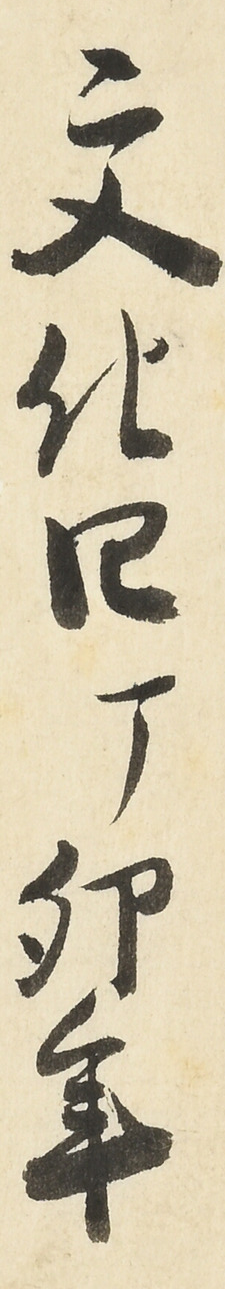文化四丁卯年
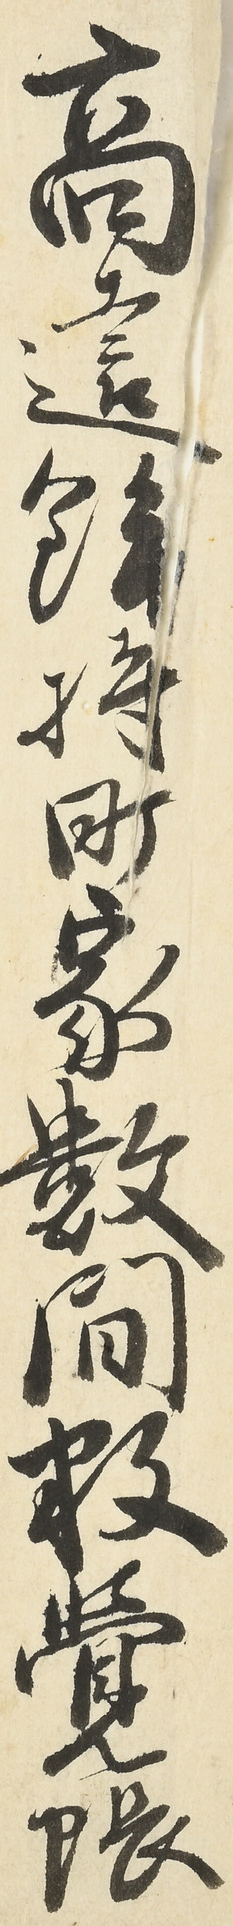高遠鉾持町家数間数覚帳
